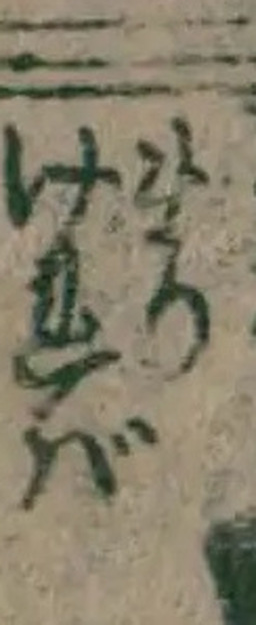ければ
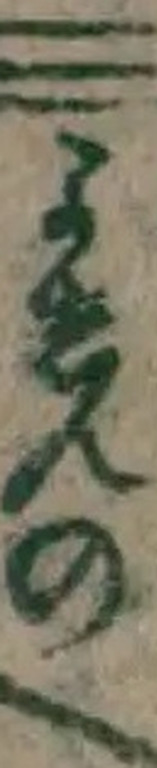よにんの
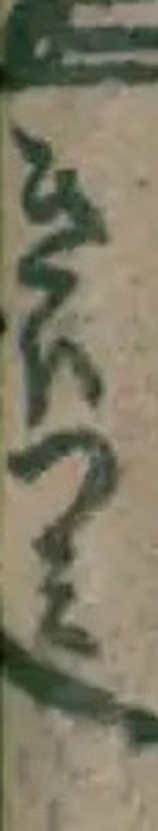きはつみ
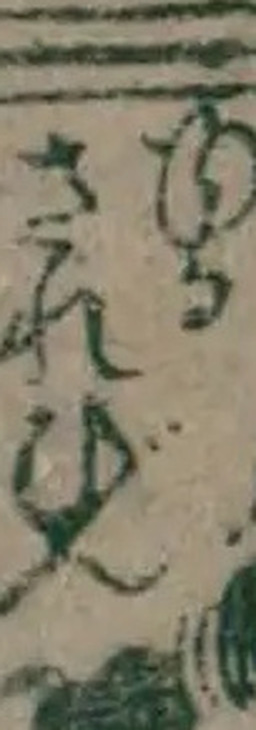されびん
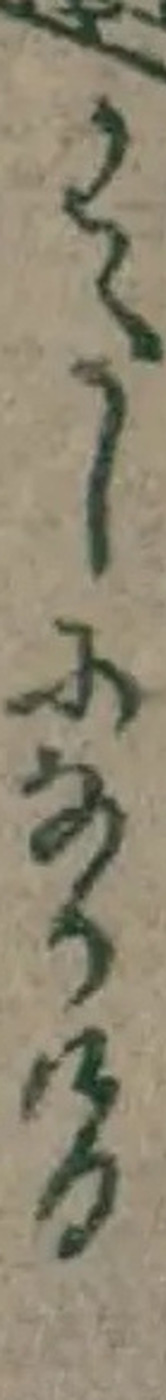わたしになりける
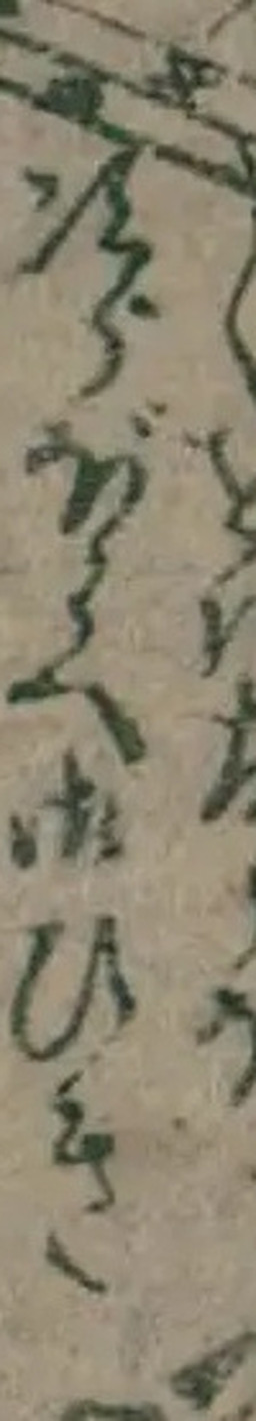次らぼうへ御ひき

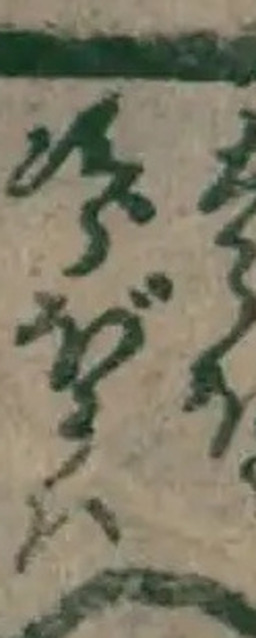次らぼうは
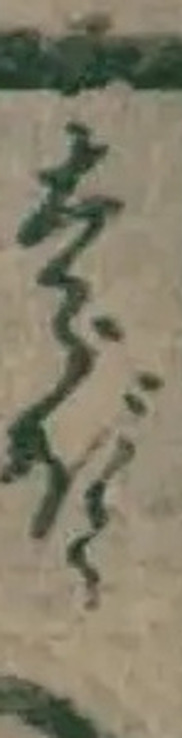太らぼう
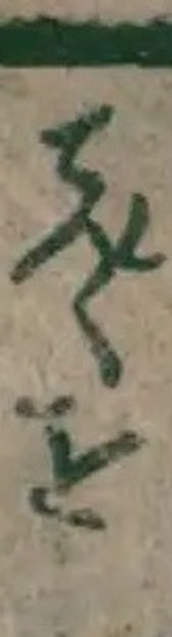てん〳〵を
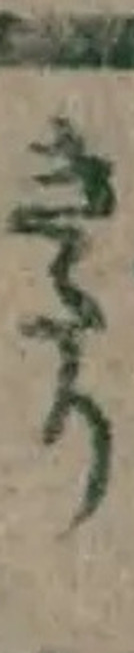きたり
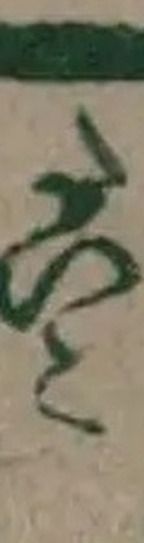たいこ
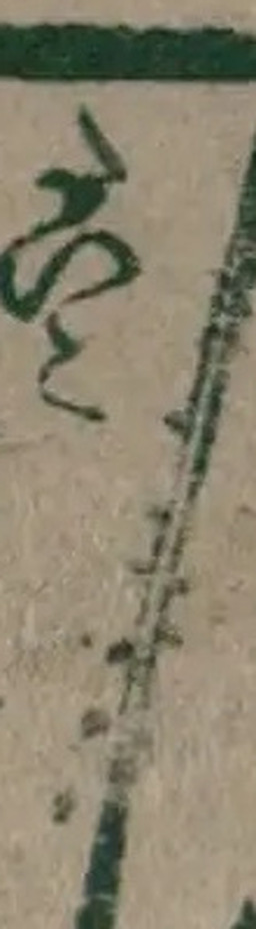たいこ
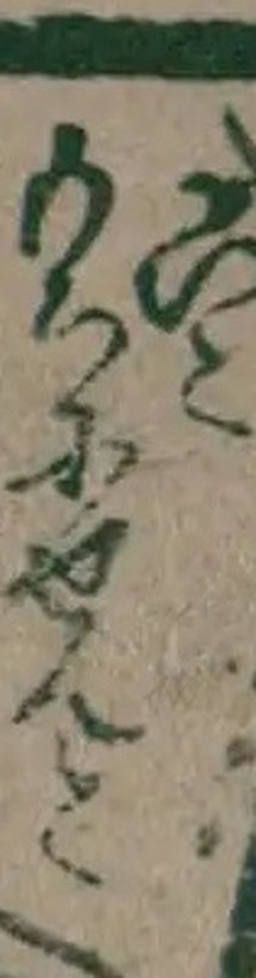もちにせんと
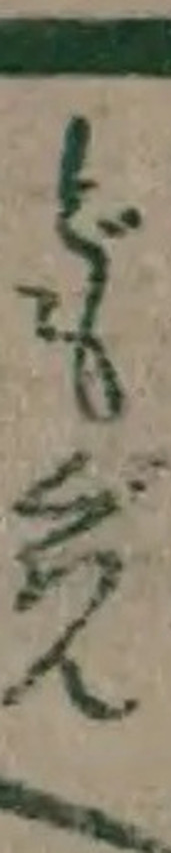どもぐわん
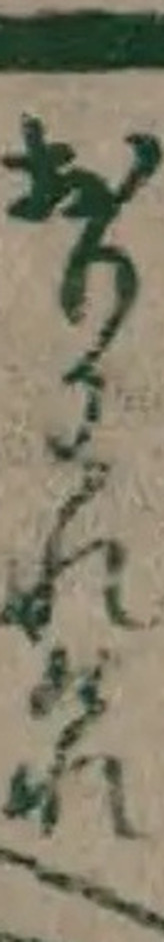おもわれけれ
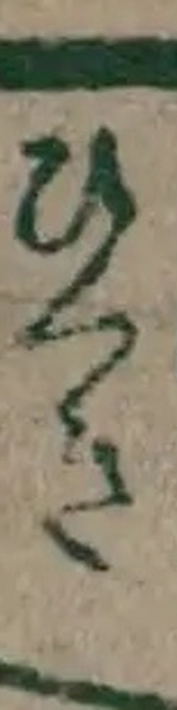ひくき
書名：頓作時雨月 3巻
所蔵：国立国会図書館 National Diet Library, JAPAN
